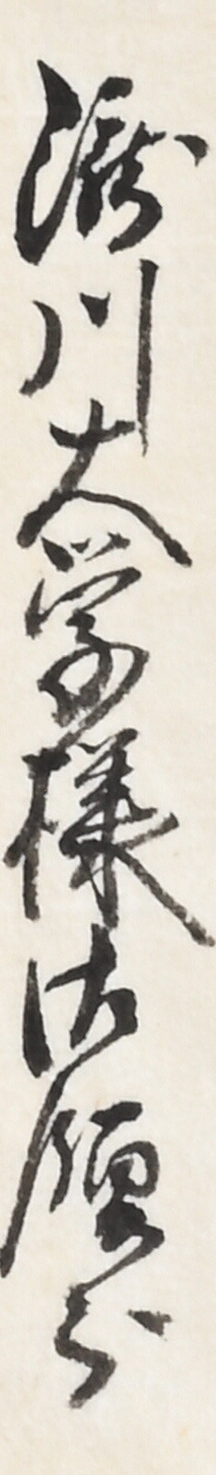瀧川大学様御領分
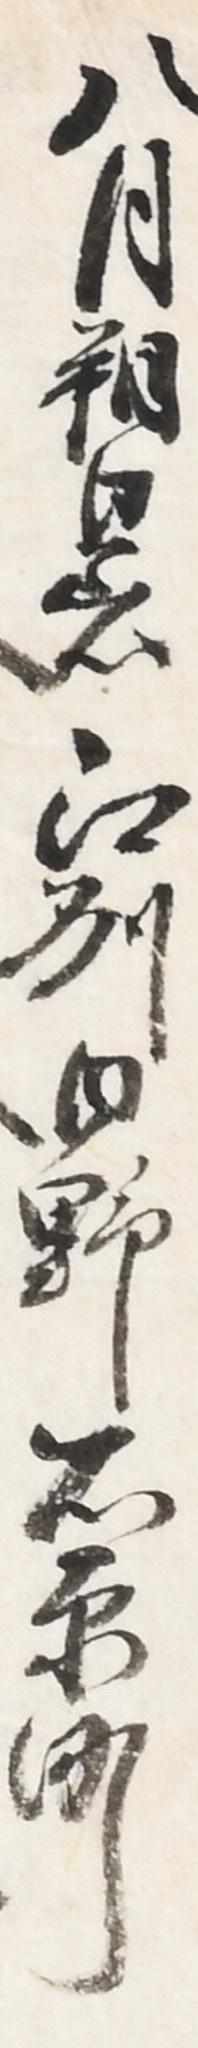八月朔日着江州日野石原町
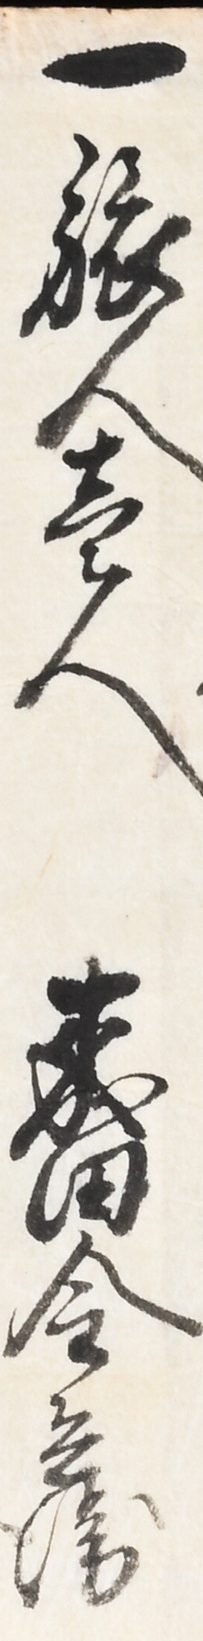一旅人壱人森田金兵衛
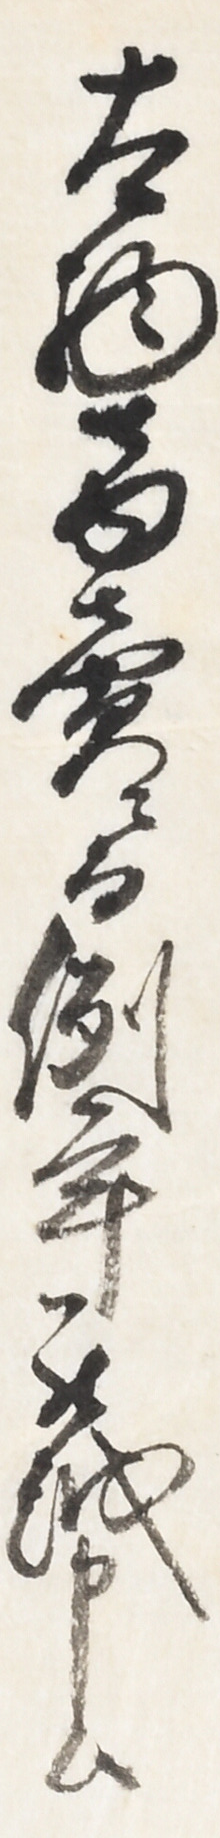太物商売ニ而例年罷越申候
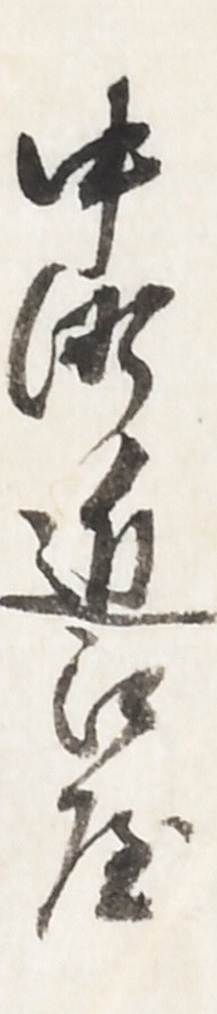中町近江屋
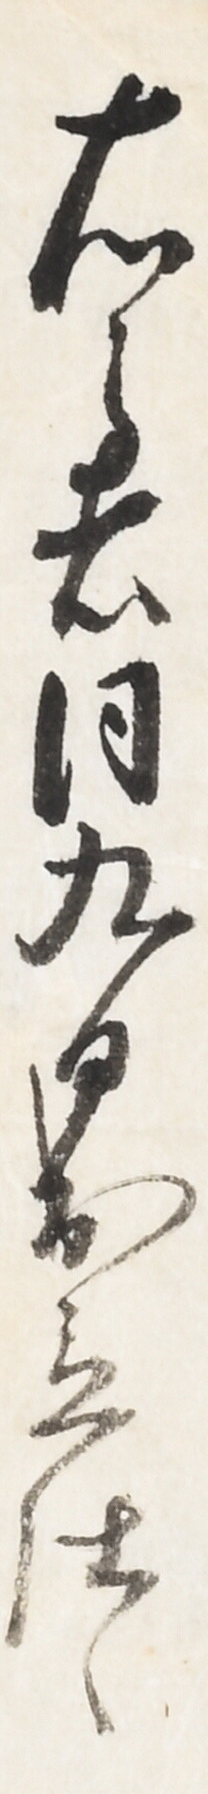右之者同九日出立仕候
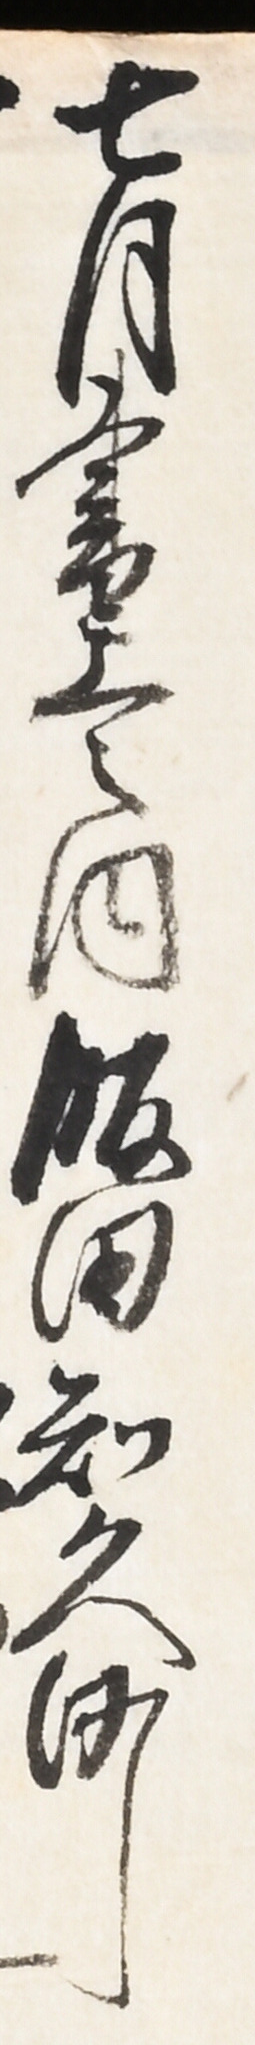七月書上之内飯田知久町
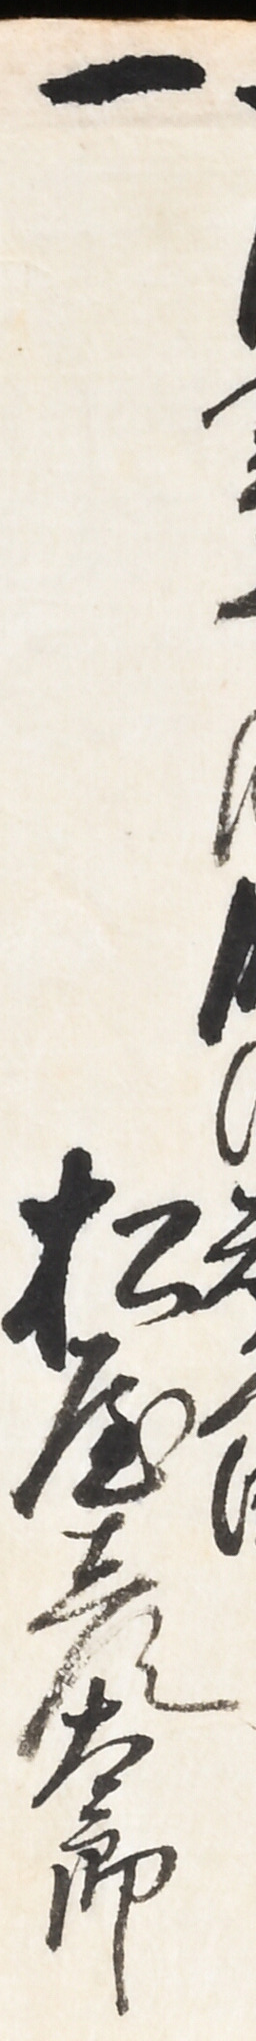一松屋彦太郎
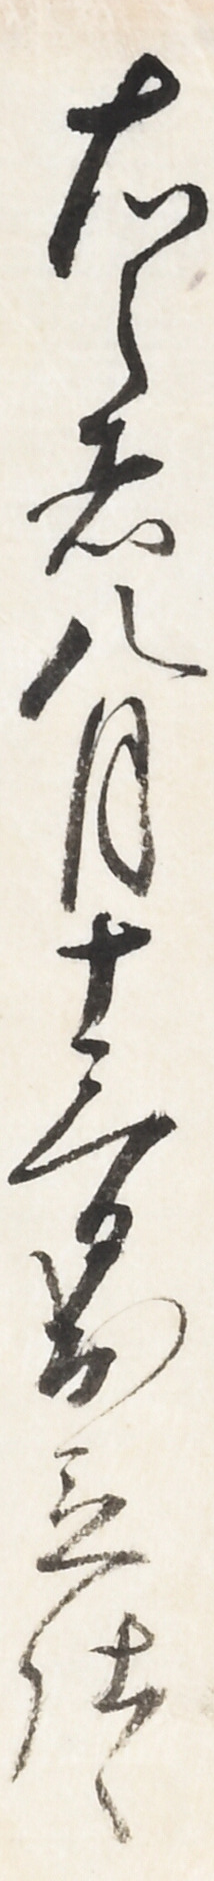右之者八月十三日出立仕候
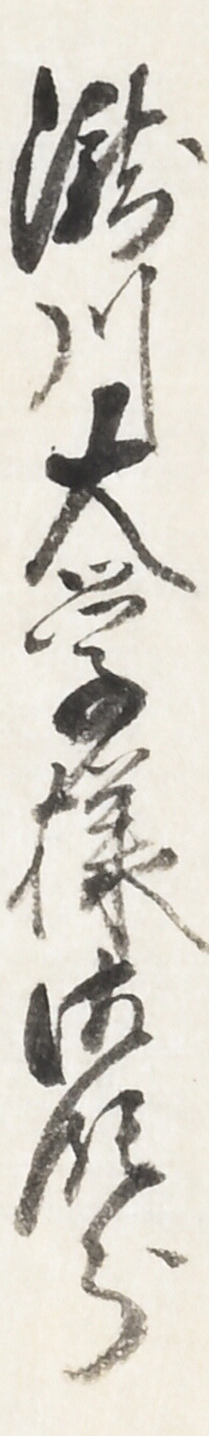瀧川大学様御領分
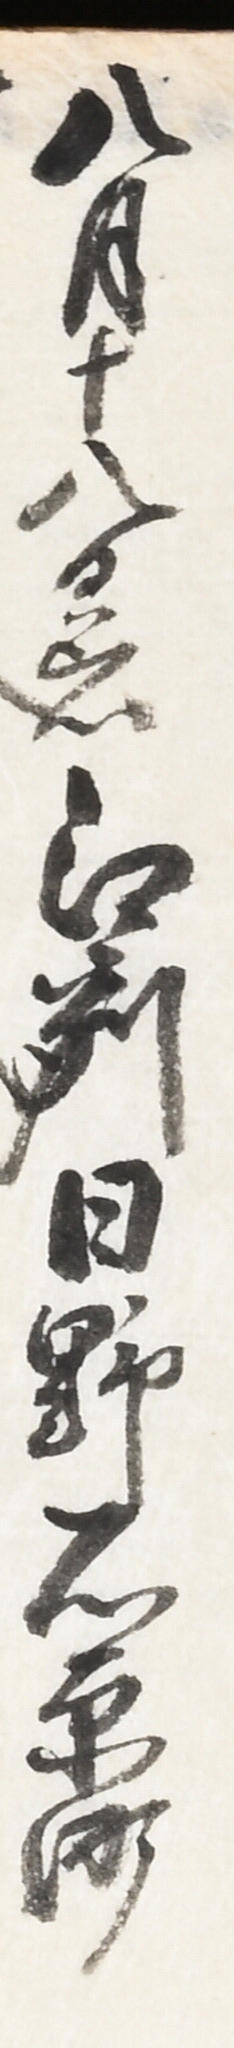八月十八日着江州日野石原村
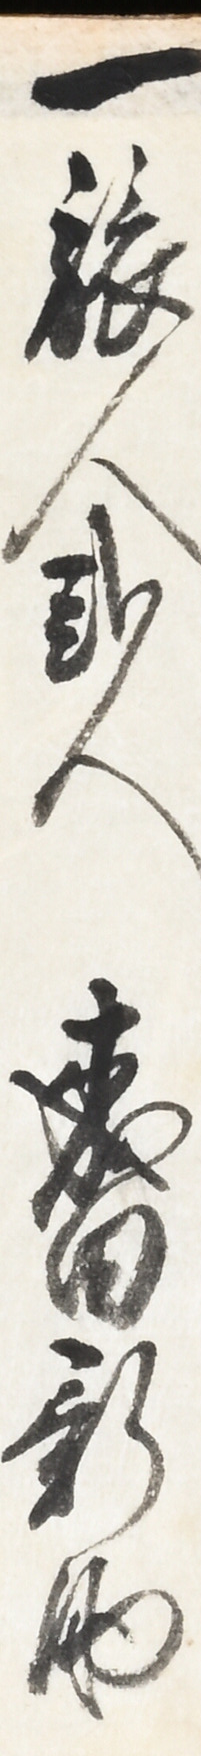一旅人弐人森田新助
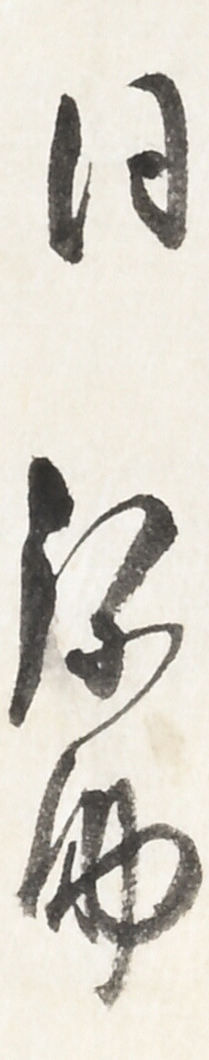同弥助
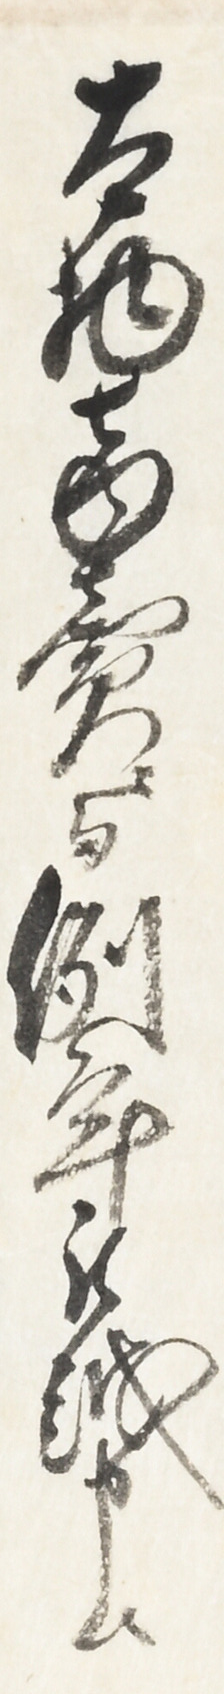太物商売ニ而例年罷越申候
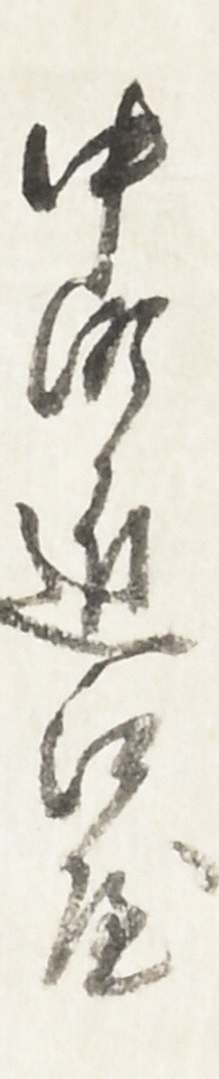中町近江屋
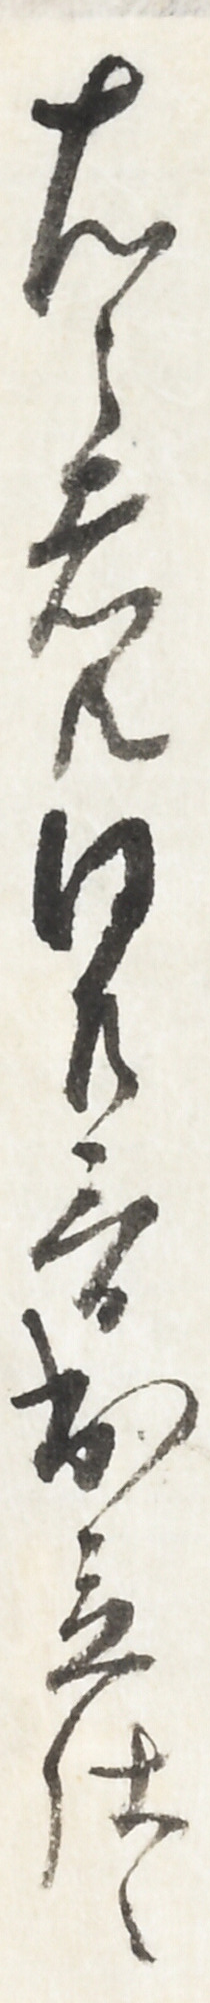右之者共同月三日出立仕候
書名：旅人泊控帳
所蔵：伊那市立高遠町図書館・合同会社AMANE
